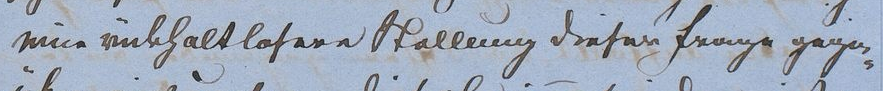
eine rükhaltlosere Stellung dieser Frage gegen-
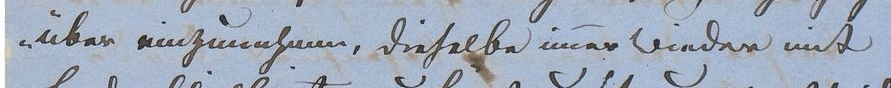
über einzunehmen, dieselbe immer wieder mit
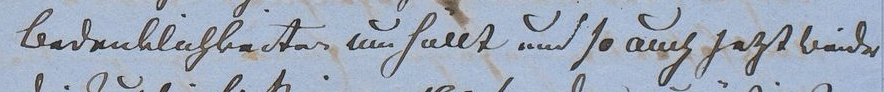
Bedenklichkeiten umhüllt und so auch jezt wieder
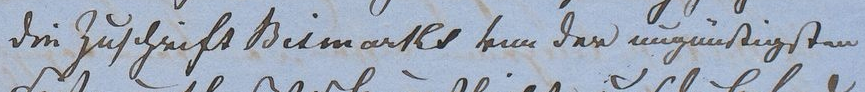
die Zuschrift Bismarcks von der ungünstigsten
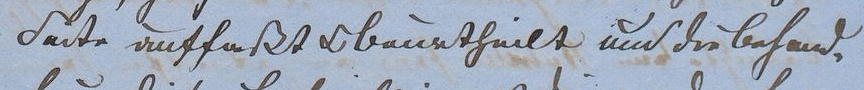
Seite auffaßt & beurtheilt und die Behand-
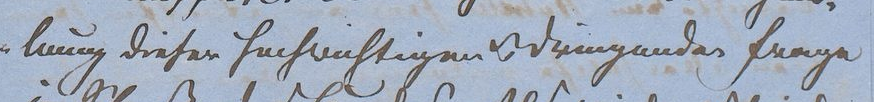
lung dieser hochwichtigen & dringenden Frage
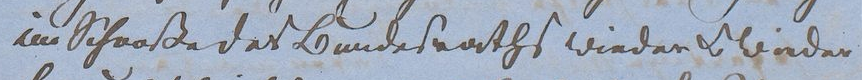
im Schooße des Bundesraths wieder & wieder
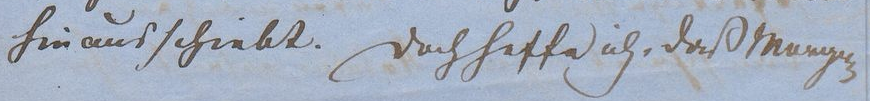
hinausschiebt. Doch hoffe ich, daß Morgen
